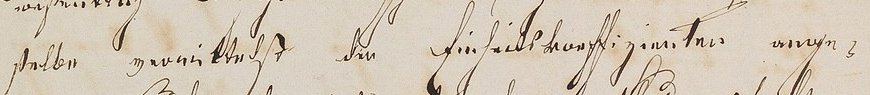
selbe vermittelst der Einheitskoeffizienten ange-
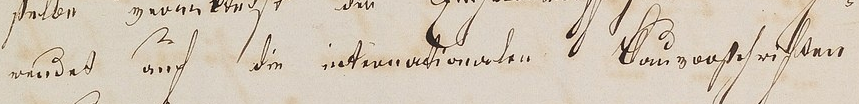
wendet auf die internationalen Bauvorschriften
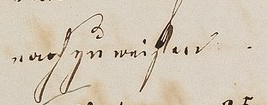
nachzuweisen.
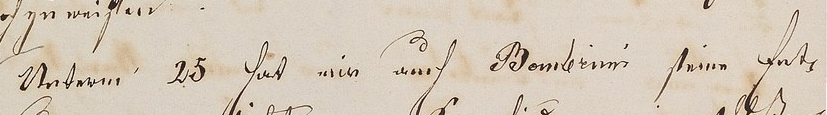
Unterm 25 hat mir auch Bombrini seine Ent-
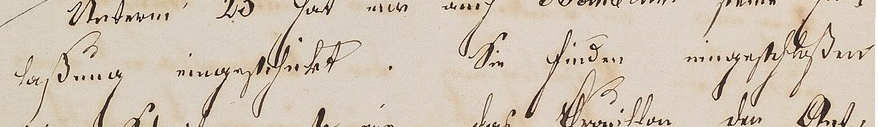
laßung eingeschickt. Sie finden eingeschloßen
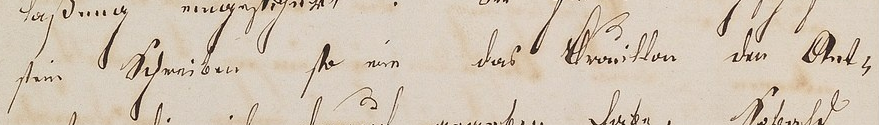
sein Schreiben so wie das Brouillon der Ant-
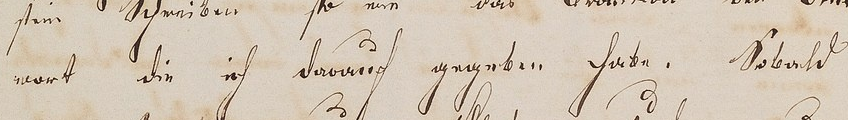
wort die ich darauf gegeben habe. Sobald
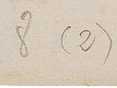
werden
